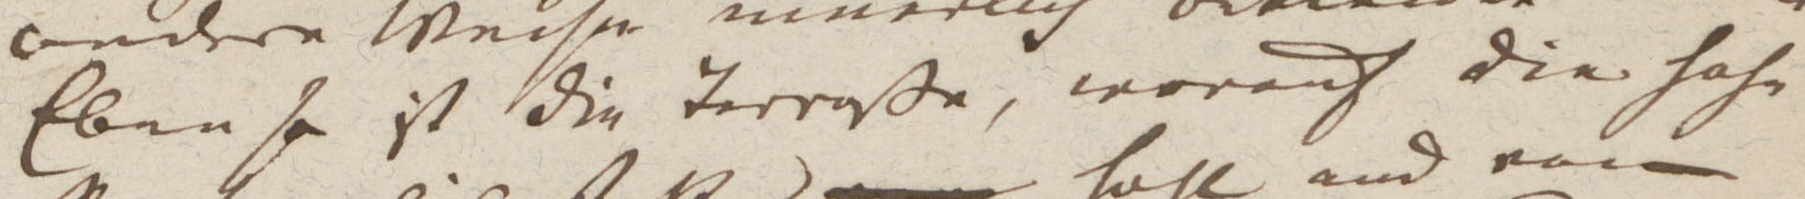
Eben so ist die Terrasse, worauf die hohe
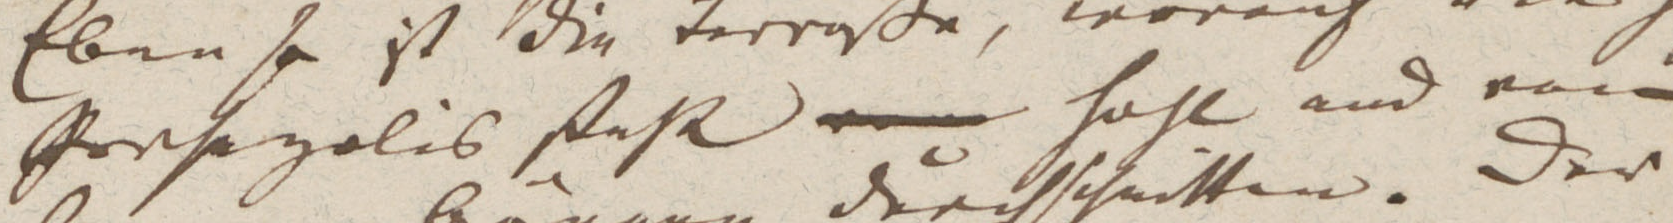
Persepolis steht von hohl und von
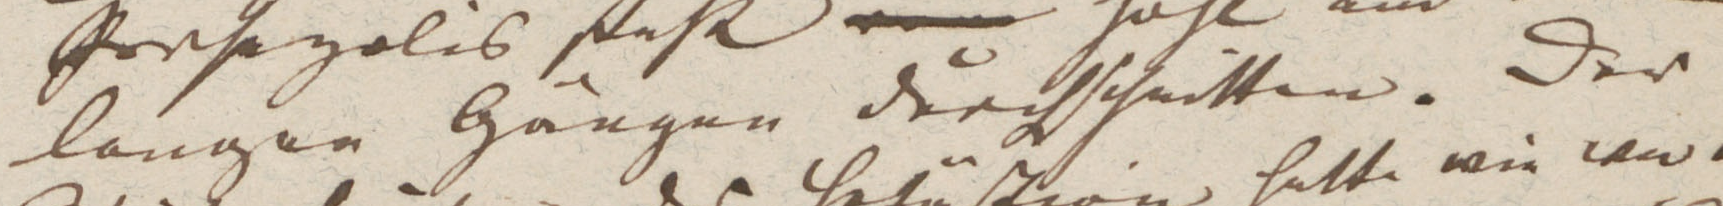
langen Gängen durchschnitten. Der
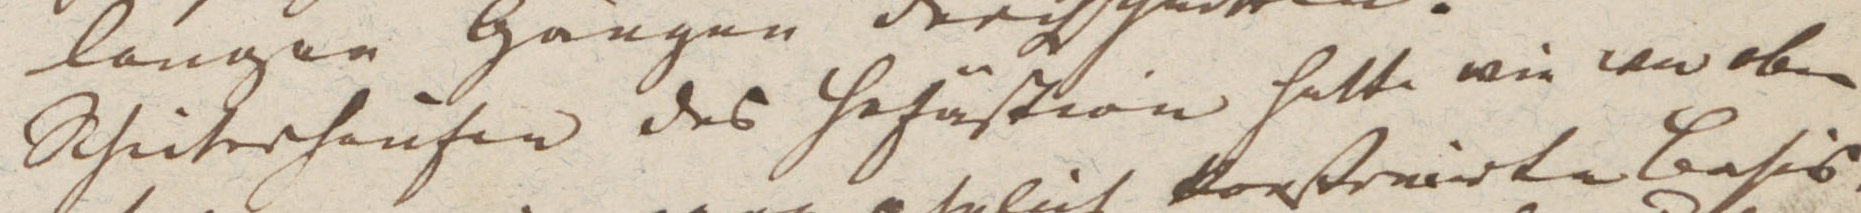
Scheiterhaufen des Hefästion hatte wie oben
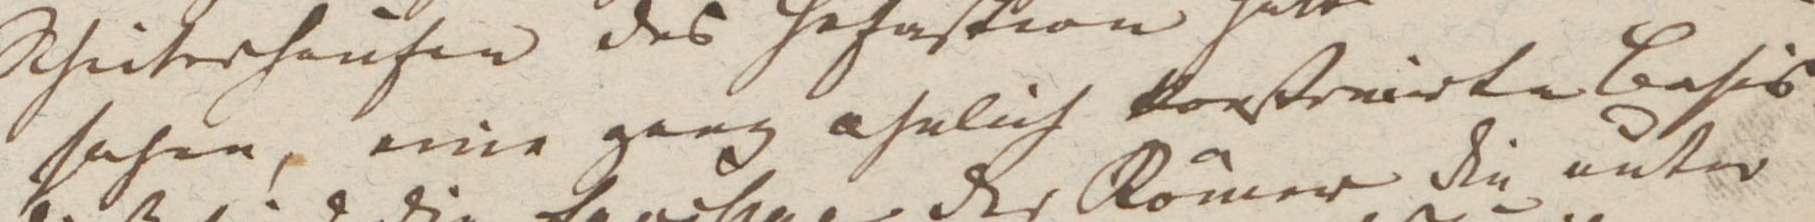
sahen, eine ganz ahnlich konstruirte Basis.
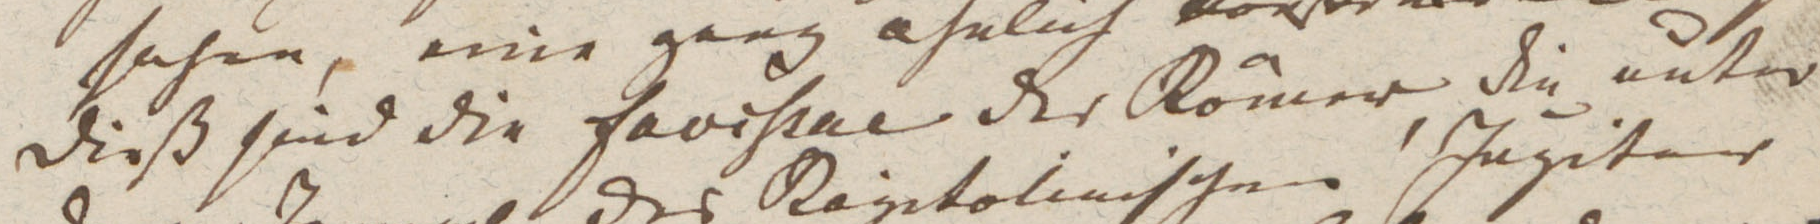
Diess sind die Favissae der Römer, die unter
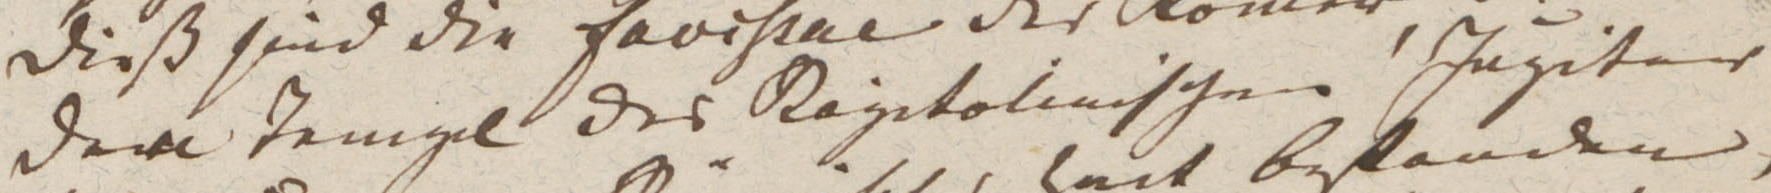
dem Tempel des Kapitolinischen Jupiter
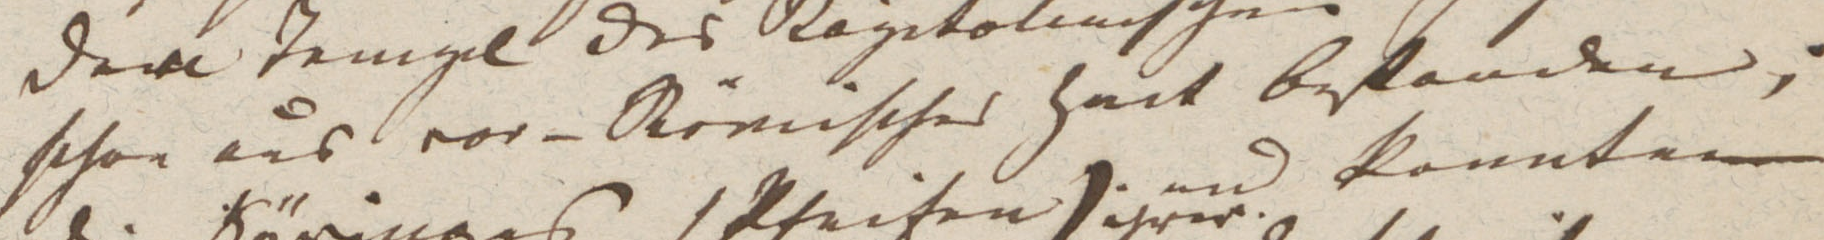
schon aus vor-Römischer Zeit bestanden;
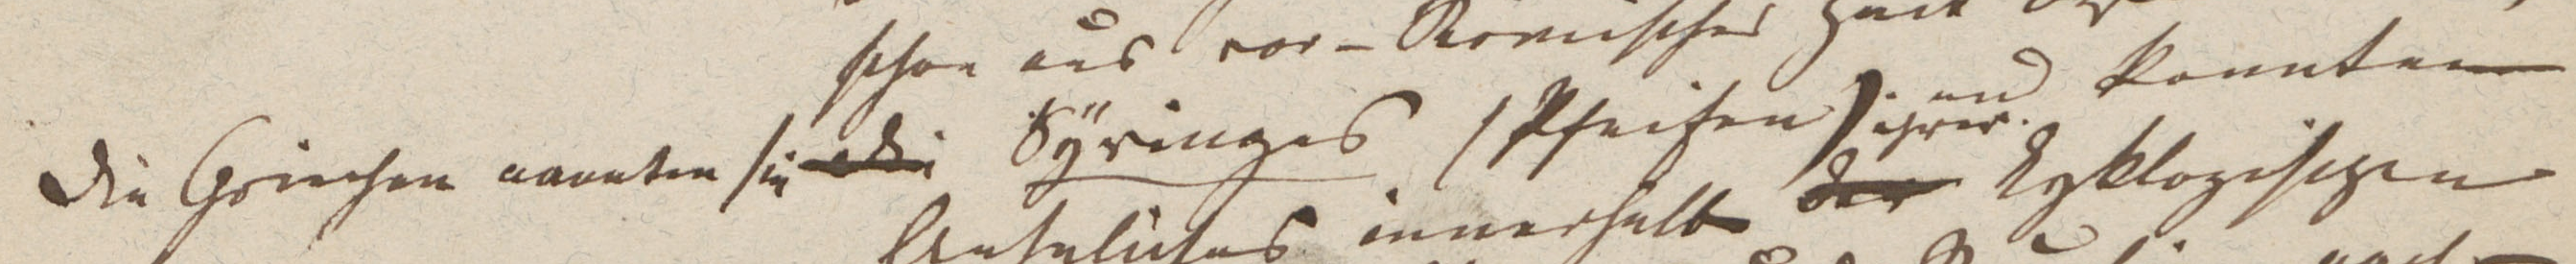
Die Griechen nannten sie die Syringes (Pfeifen) und konnten
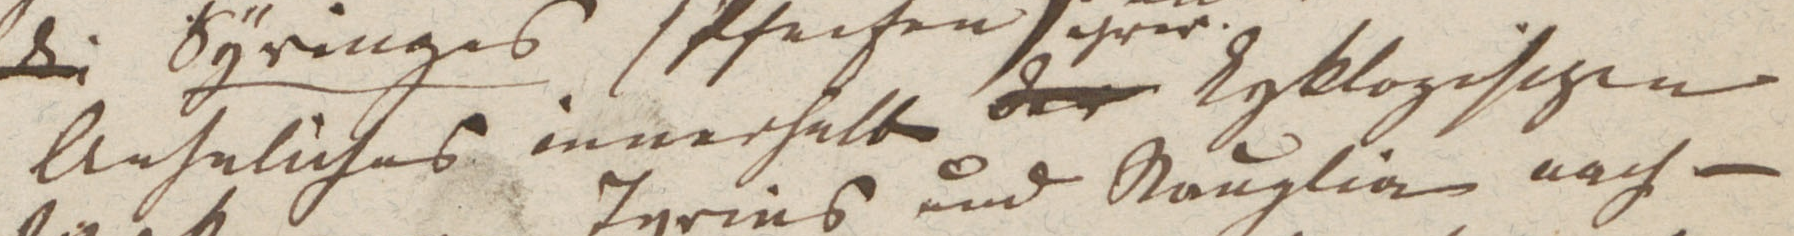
Aehnliches innerhalb der ihrer kyklopischen
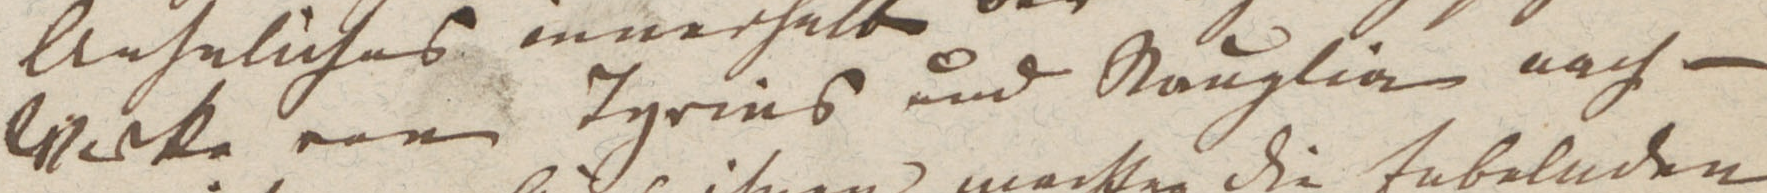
Werke von Tyrins und Nauplia nach-
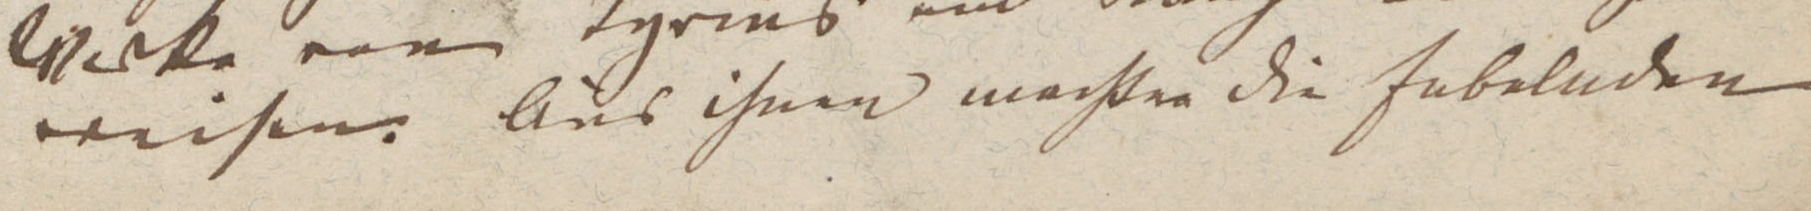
weisen. Aus ihnen machten sie fabelnden
